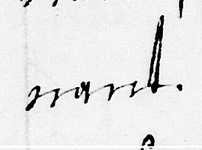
nant.
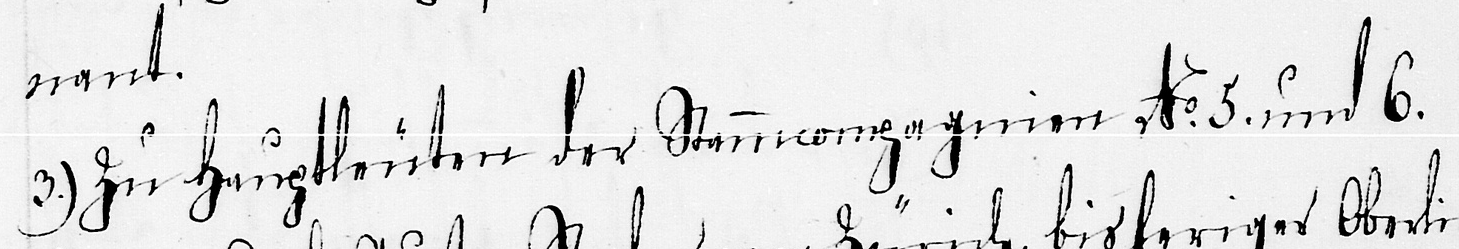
3.) Zu Hauptleuten der Stammcompagnien No. 5. und 6.
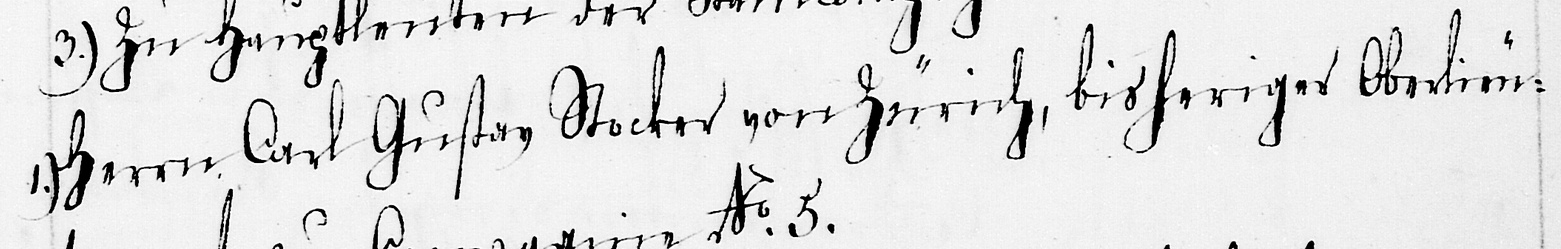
Herrn Carl Gustav Stocker von Zürich, bisheriger Oberlieu¬
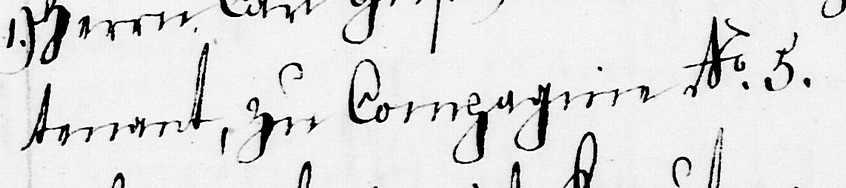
tenant, zu Compagnie No. 5.
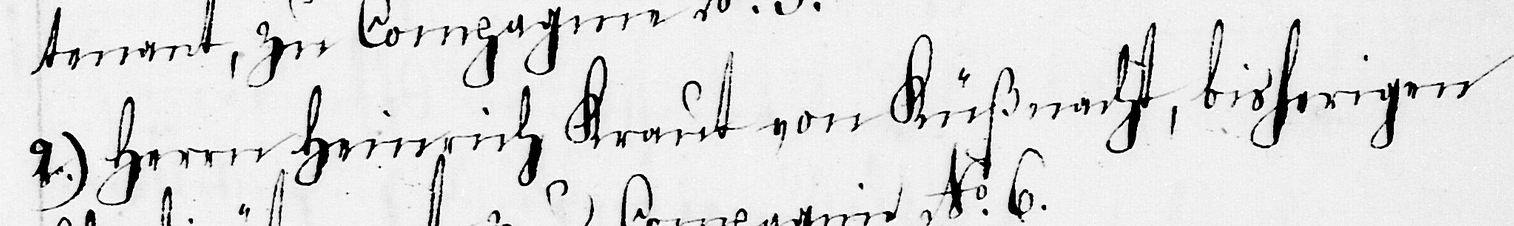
2.) Herrn Heinrich Kraut von Küßnacht, bisherigen
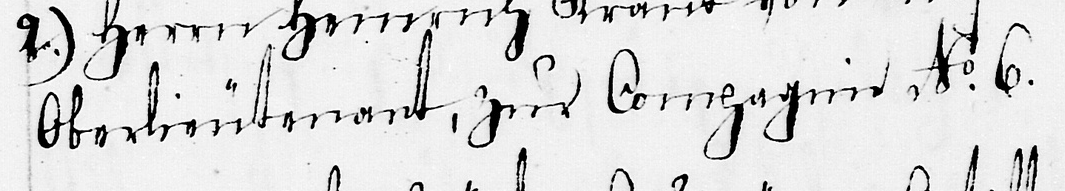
Oberlieutenant, zur Compagnie No. 6.
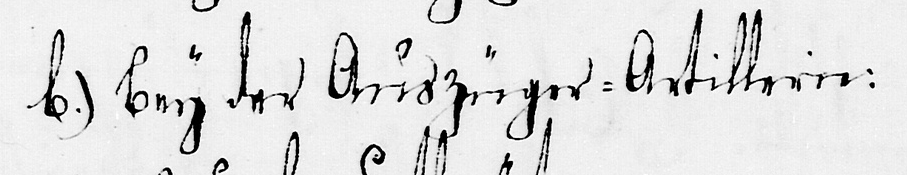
b.) Bey der Auszüger-Artillerie:
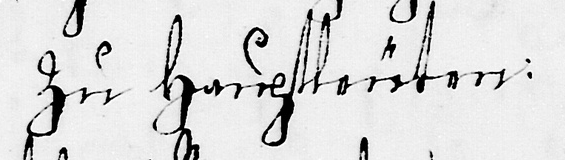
Zu Hauptleuten:
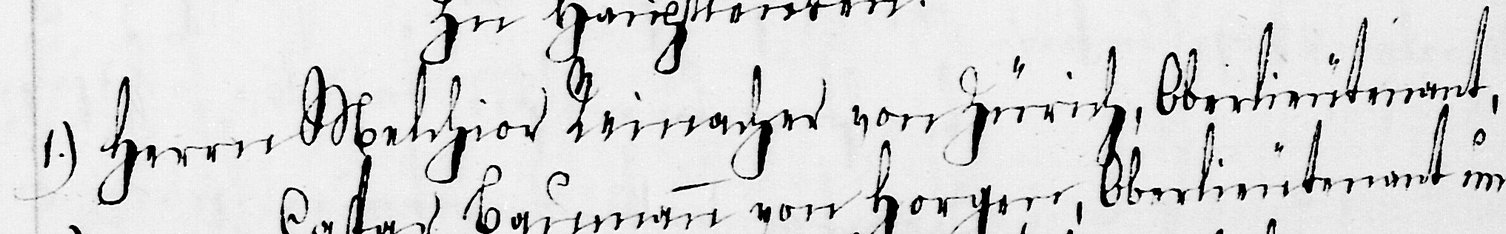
1.) Herrn Melchior Reinacher von Zürich, Oberlieutenant,
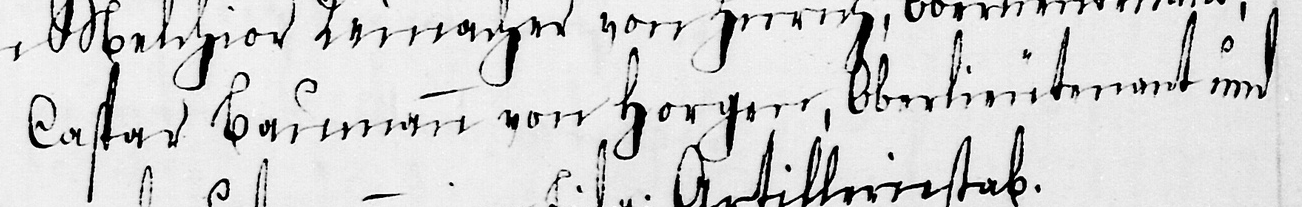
Caspar Baumann von Horgen, Oberlieutenant und
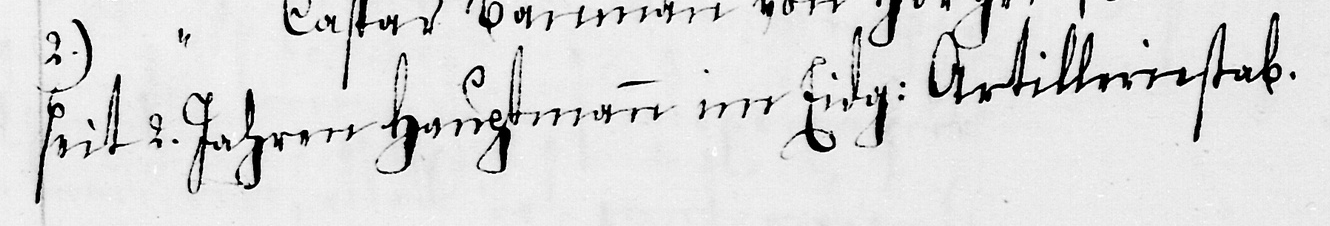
seit 2. Jahren Hauptmann im Eidg. Artilleriestab.
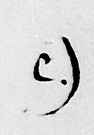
2.)
